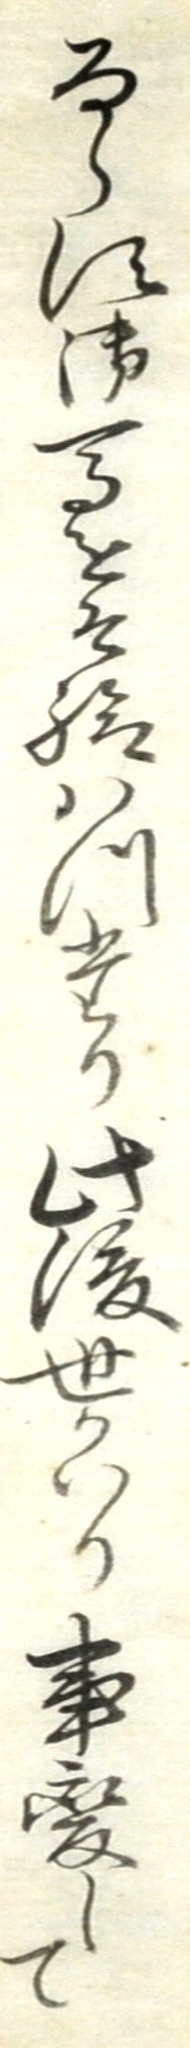ならす御馬をそ給はつたり此後世かはり事変して
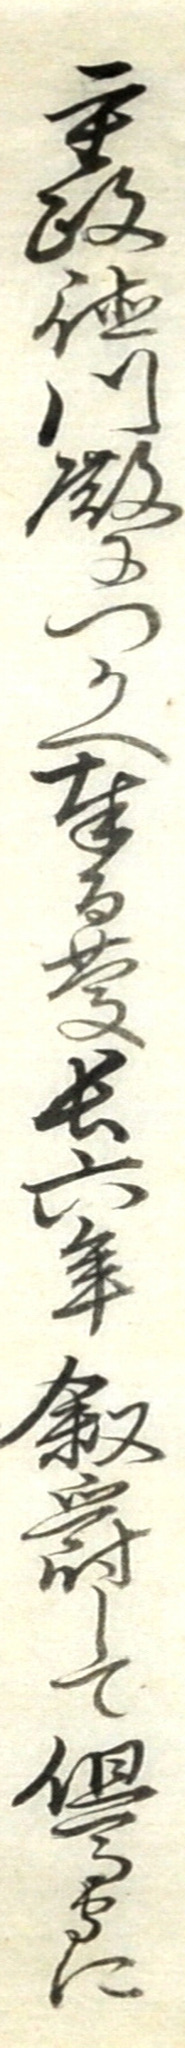重政徳川殿につかへ奉る慶長六年叙爵して但馬守に
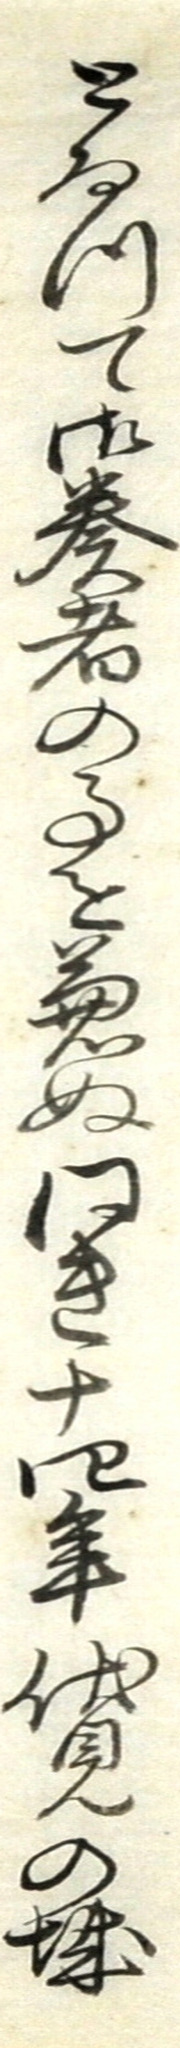となつて御奏者の事を兼ぬ同き十四年伏見の城
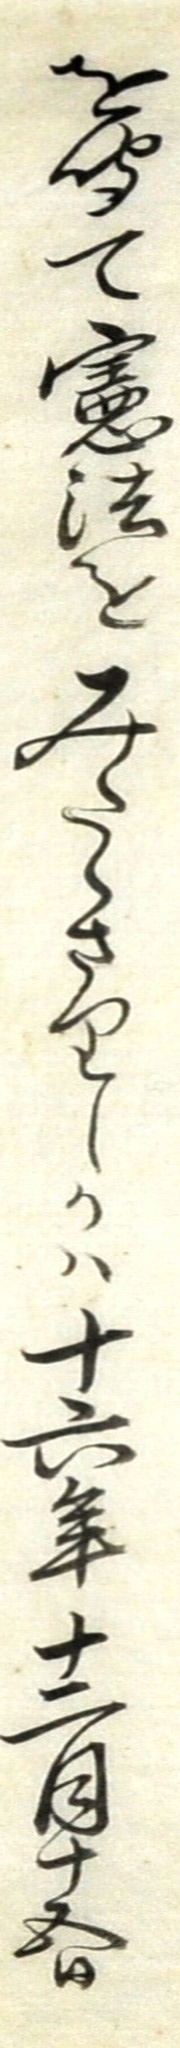を聞て憲法をみたゝさりしかは十六年十二月十五日
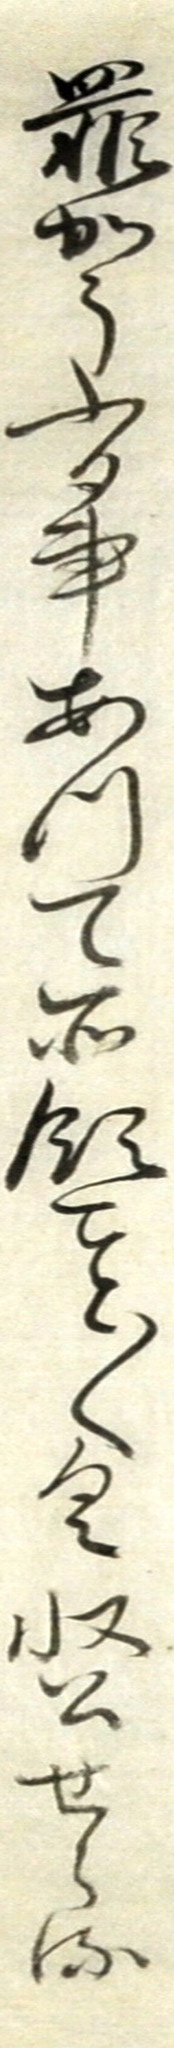罪かうふる事あつて所領こと〳〵く收公せらる

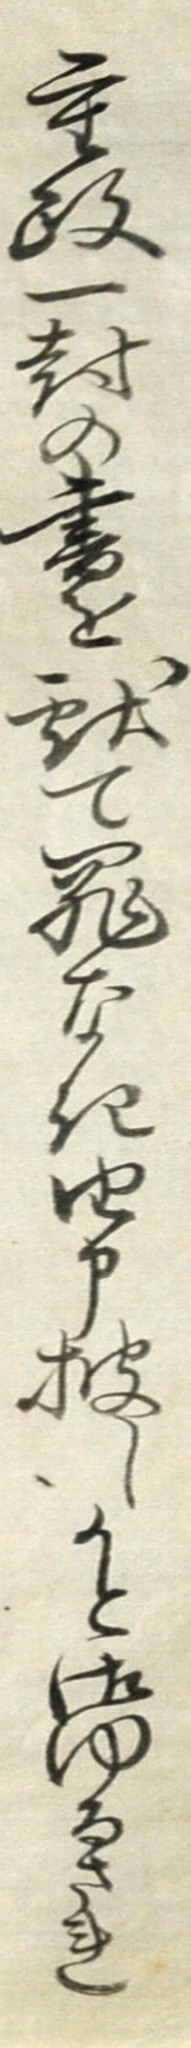重政一封の書を献て罪なき由申披しかと御ゆるされ
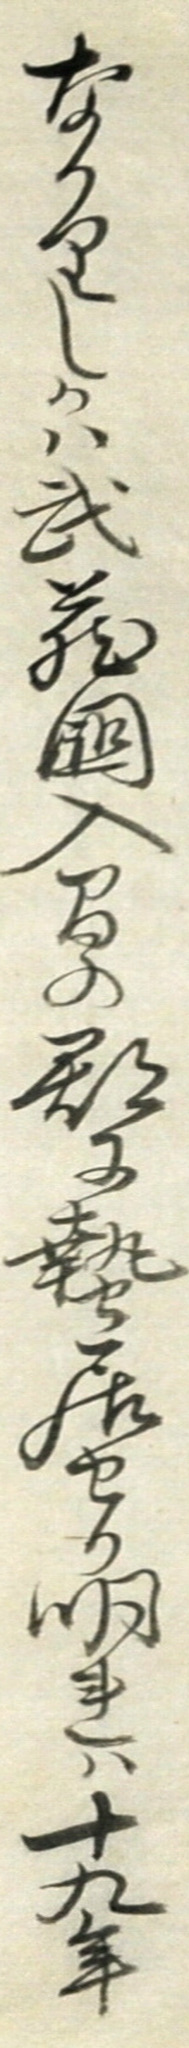なかりしかは武蔵国入間の郡に蟄居せり明れは十九年
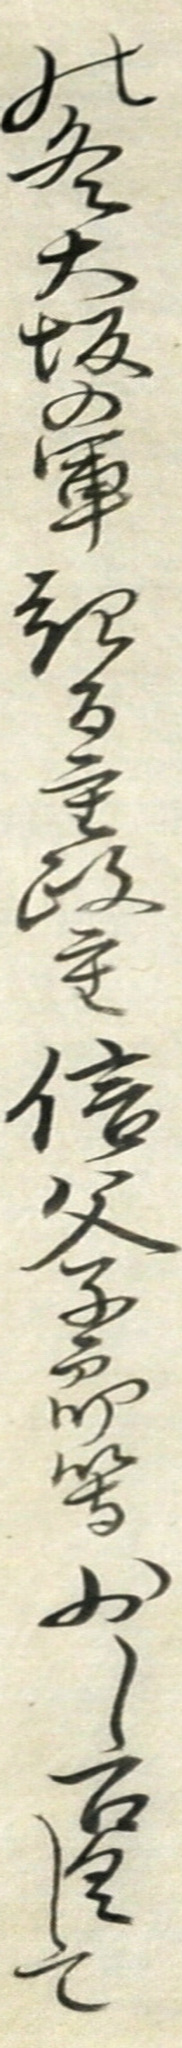の冬大坂の軍起る重政重信父子郎等少し召具して
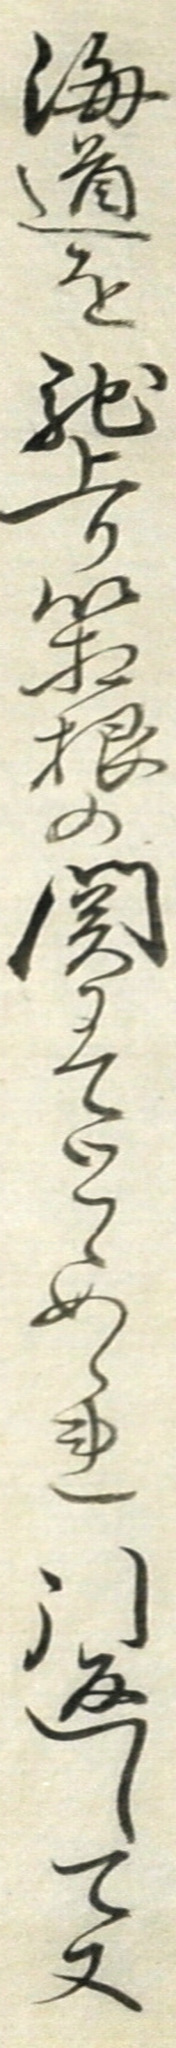海道を馳上り箱根の関にてとゝめられ引返して又
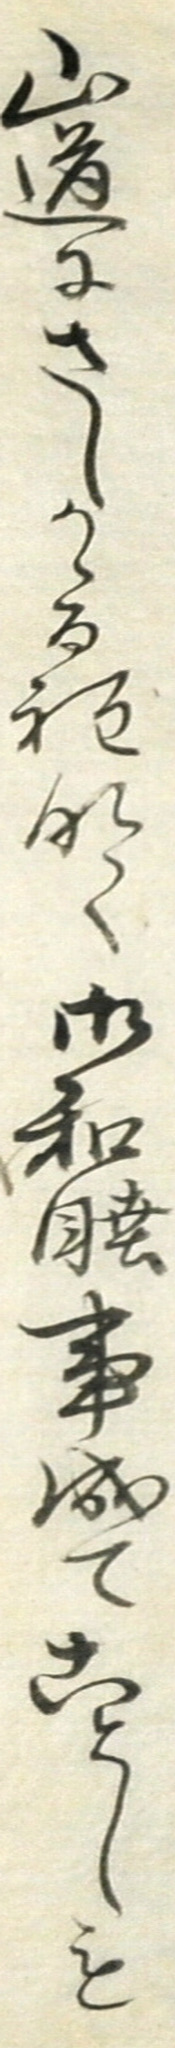山道にさしかゝる程なく御和睦事成てことしも
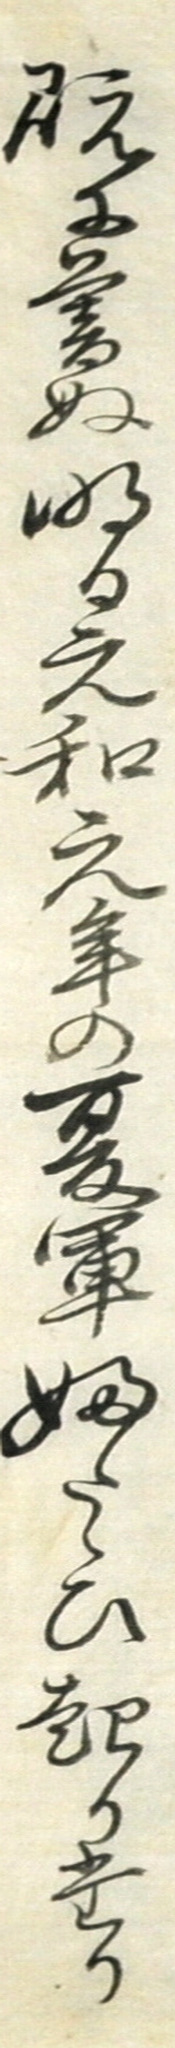既に暮ぬ明る元和元年の夏軍ふたゝひ起りたり
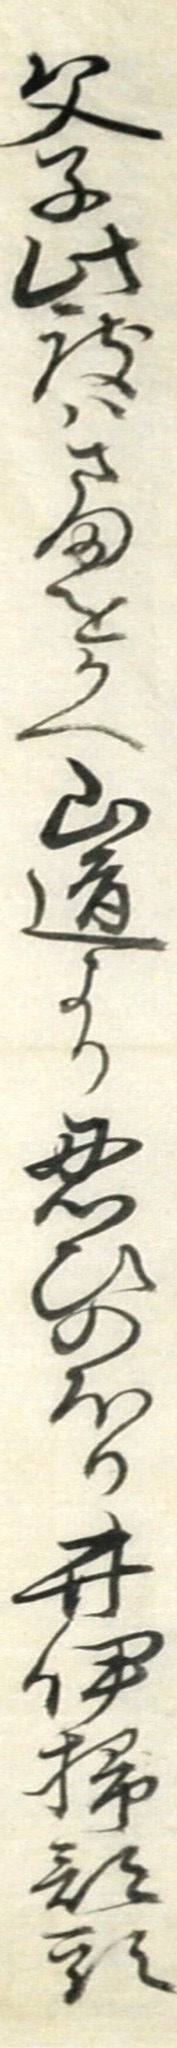父子此度はさまをかへ山道より忍ひのほり井伊掃部頭
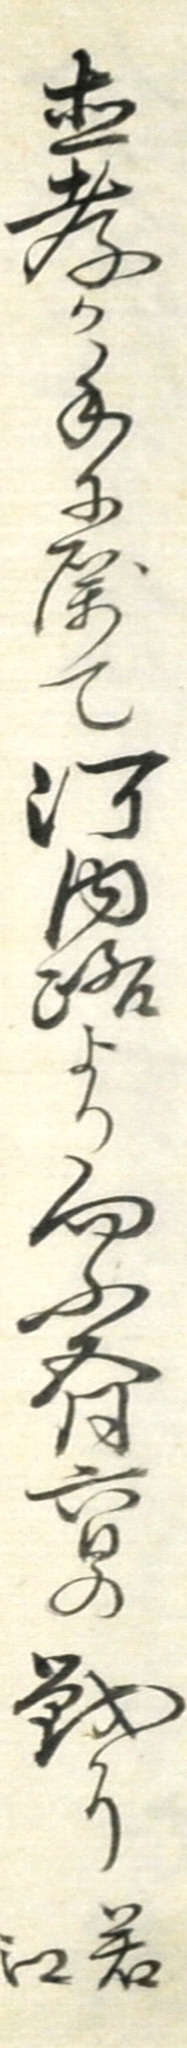直孝か手に属て河内路より向ふ五月六日の戦に若江
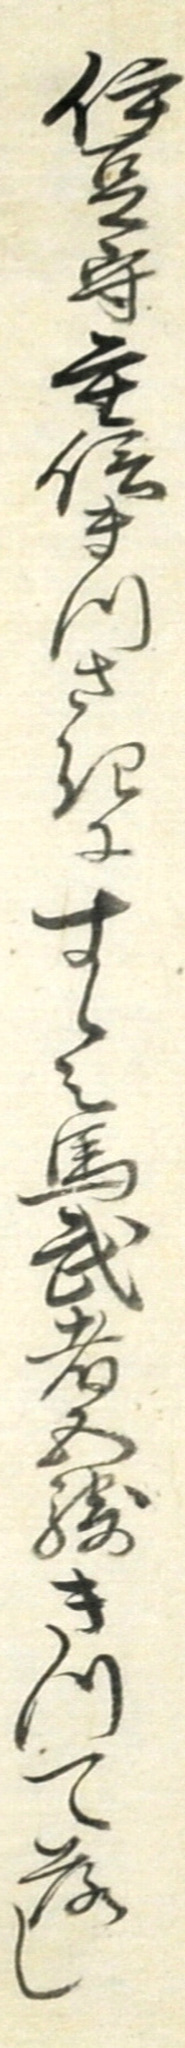伊豆守重信まつさきにすゝみ馬武者五騎きつて落し
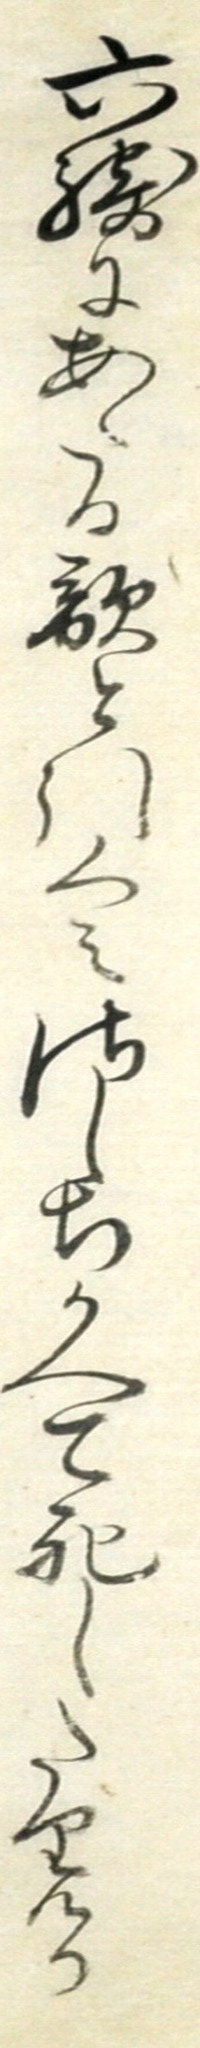六騎にあたる敵と引くみさしちかへて死したりけり

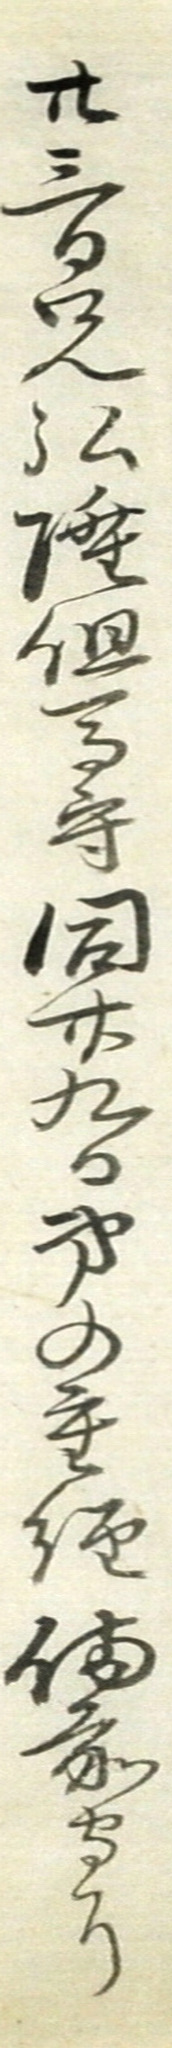廿三日兄弘隆但馬守同廿九日弟の重経備前守に
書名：藩翰譜（六）
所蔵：伊那市立高遠町図書館・合同会社AMANE
